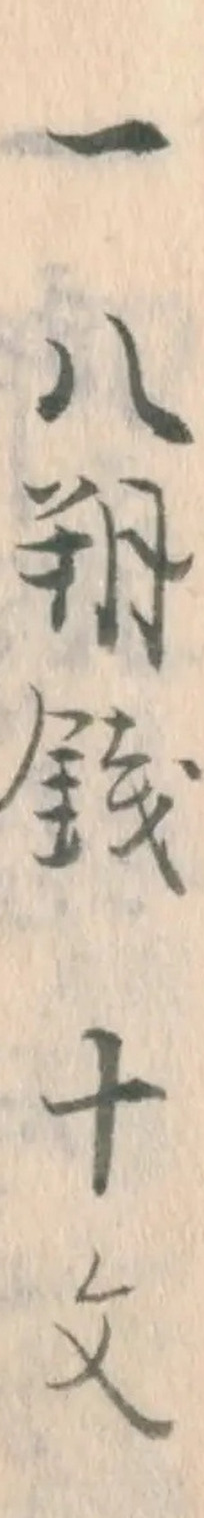一八朔銭十文
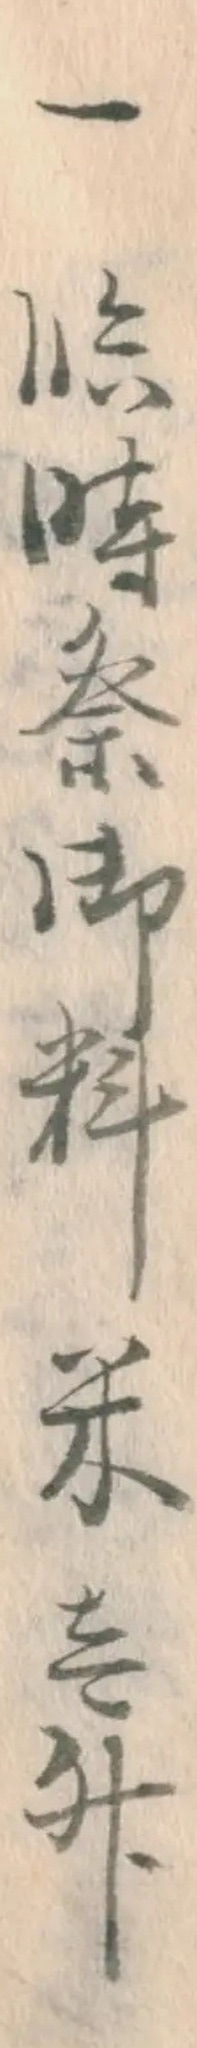一臨時祭御料米壱升
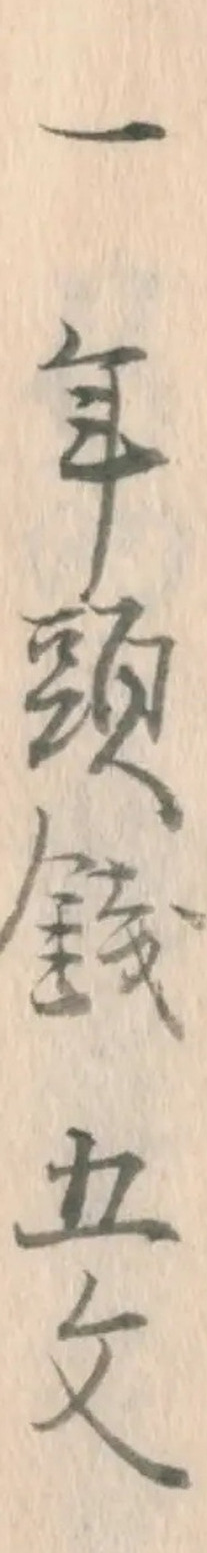一年頭銭五文
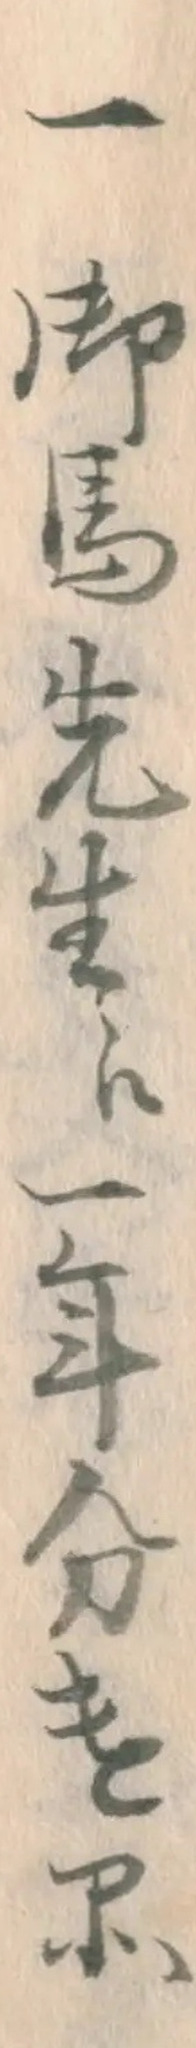一御馬先生え一年分遣品
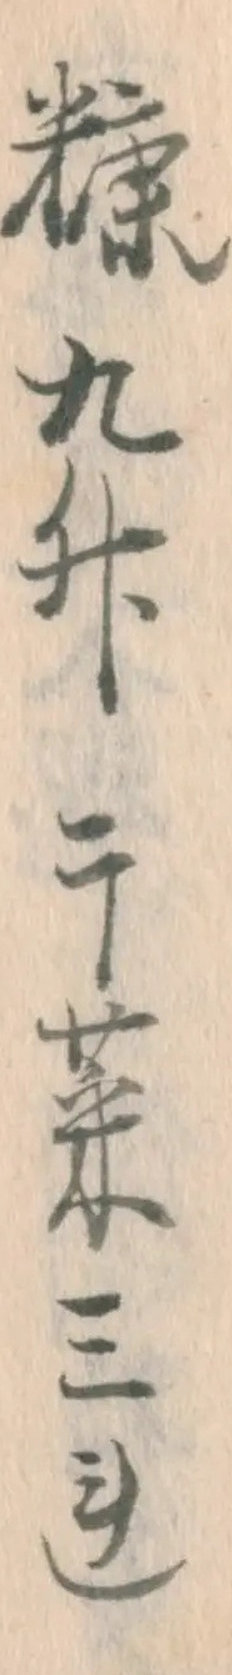糠九升干菜三連
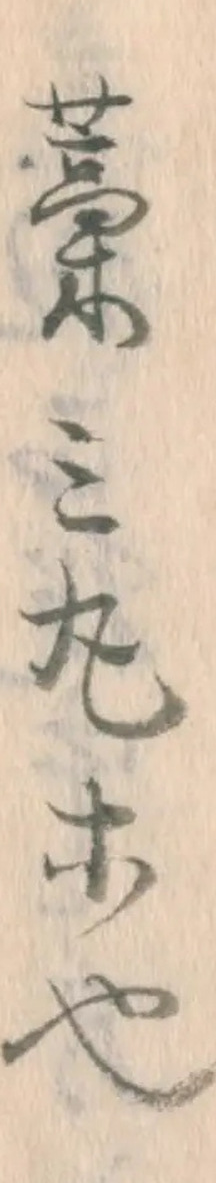藁三丸等也
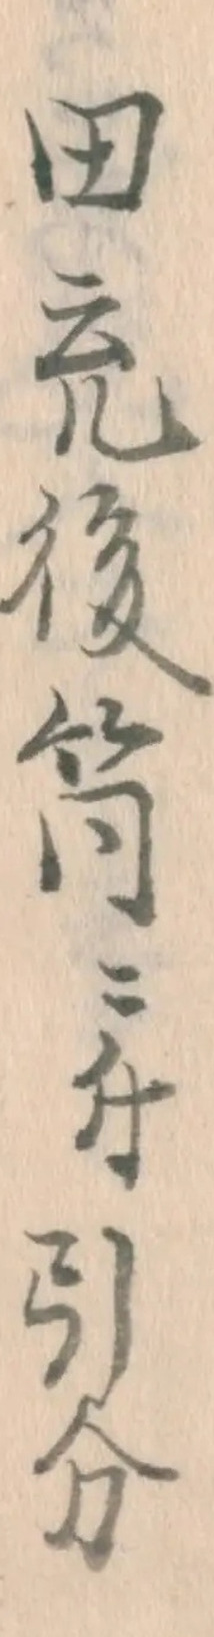田充後筒に付引分
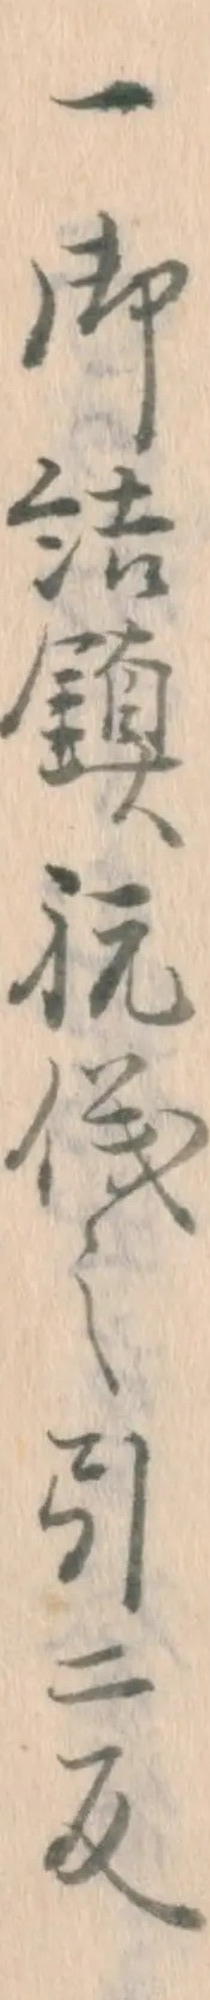一御結鎮祝儀之引二反
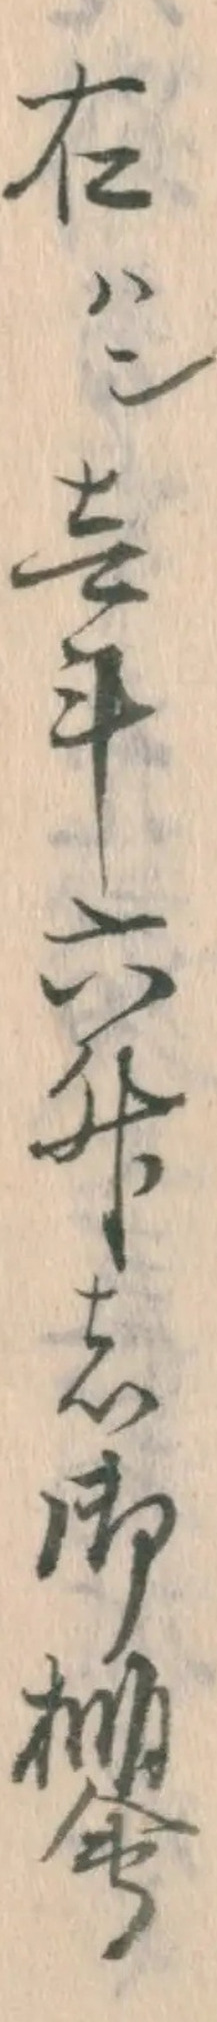右ハン壱斗六升は御棚會
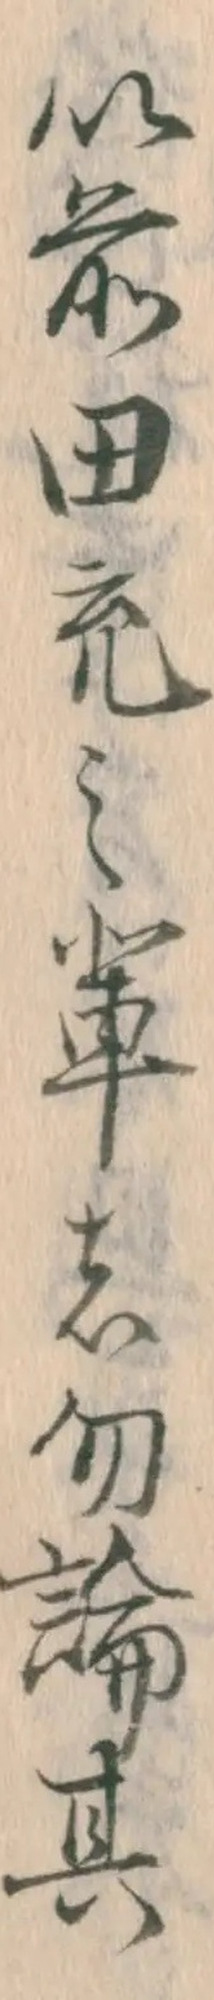以前田充之輩は勿論其
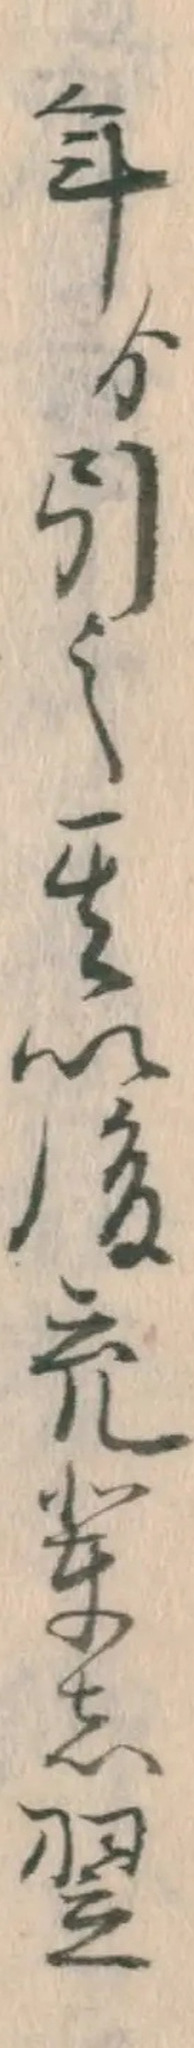年ゟ引之其以後充輩は翌
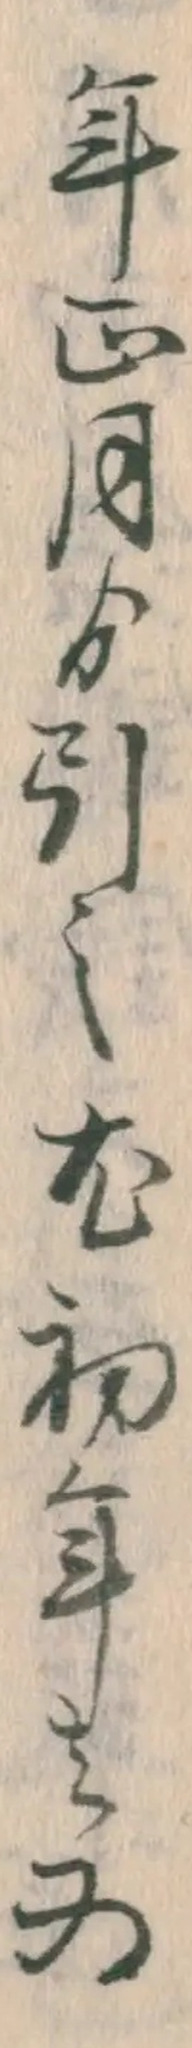年正月ゟ引之尤初年は為
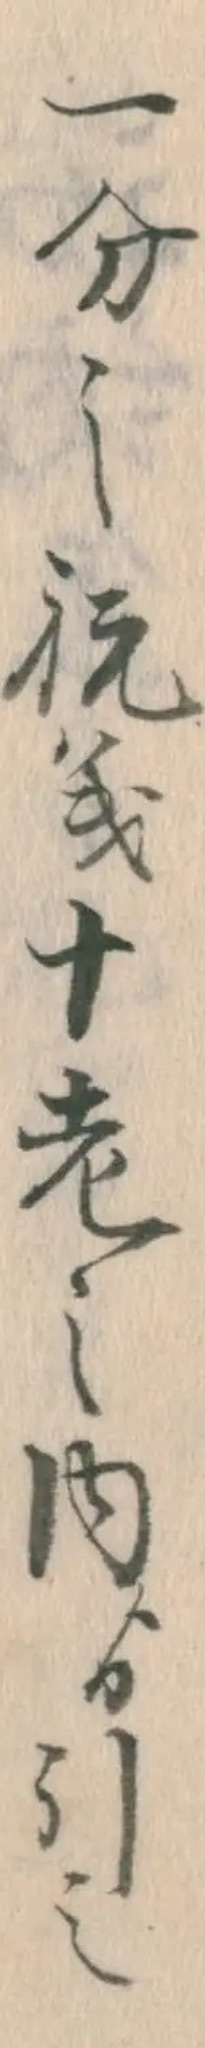一分之祝義十老之内ゟ引之
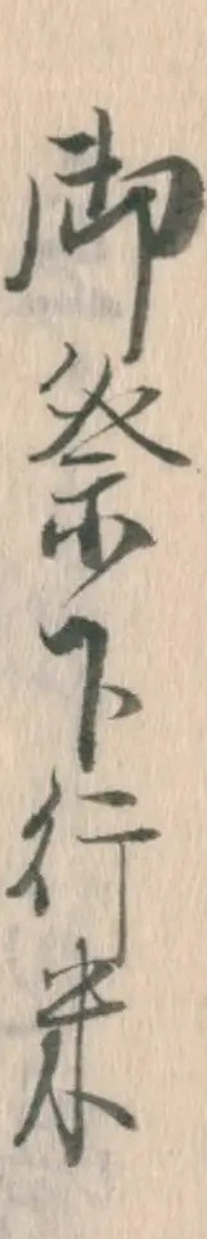一御祭下行米
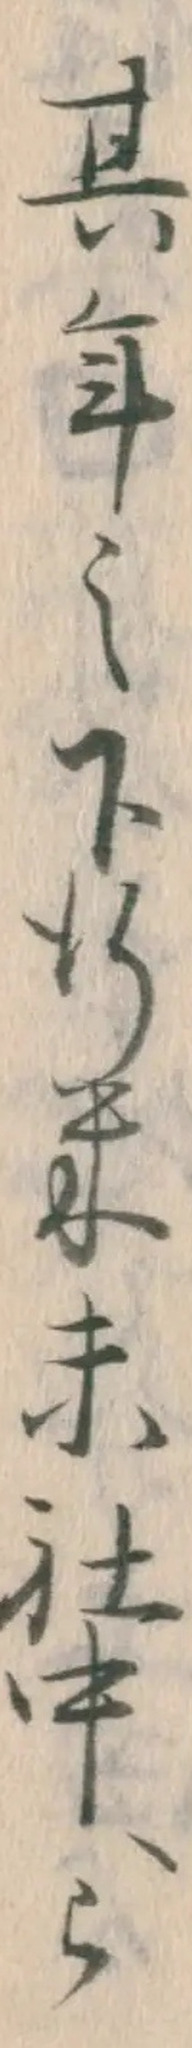其年之下行米未社中被
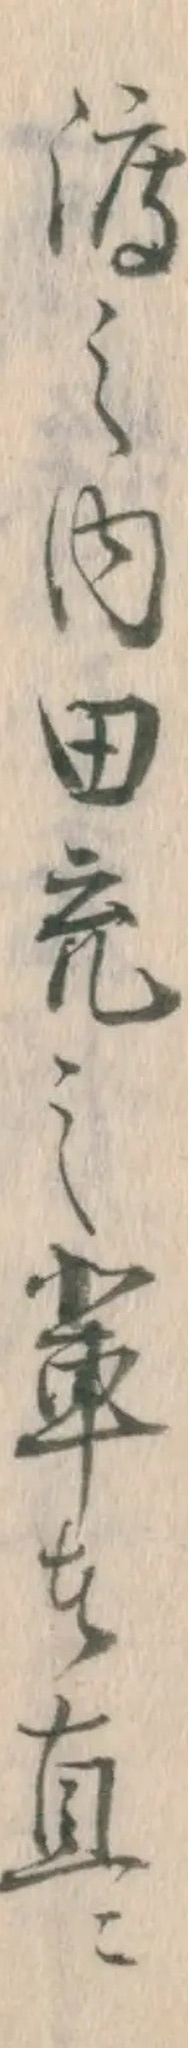渡之内田充之輩は直ニ
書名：賀茂社記録. 第81冊
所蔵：国立国会図書館 National Diet Library, JAPAN
